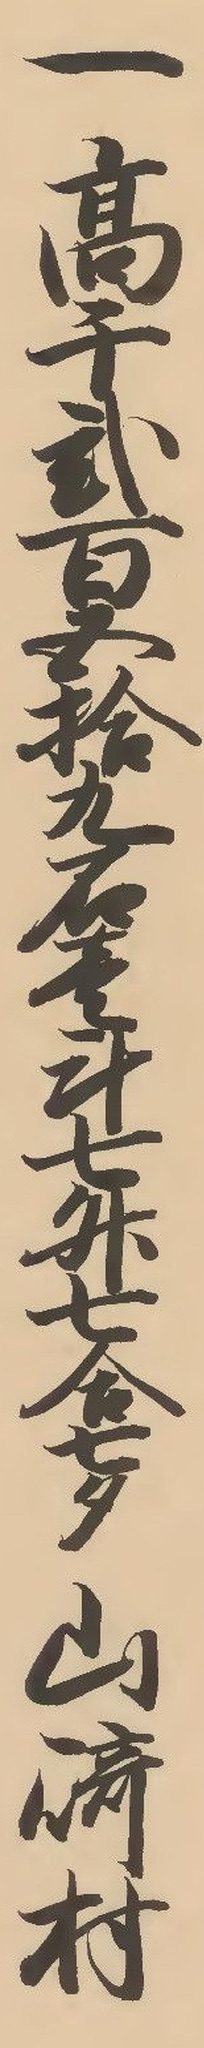一高千弐百五拾九石壱斗七升七合七勺山崎村
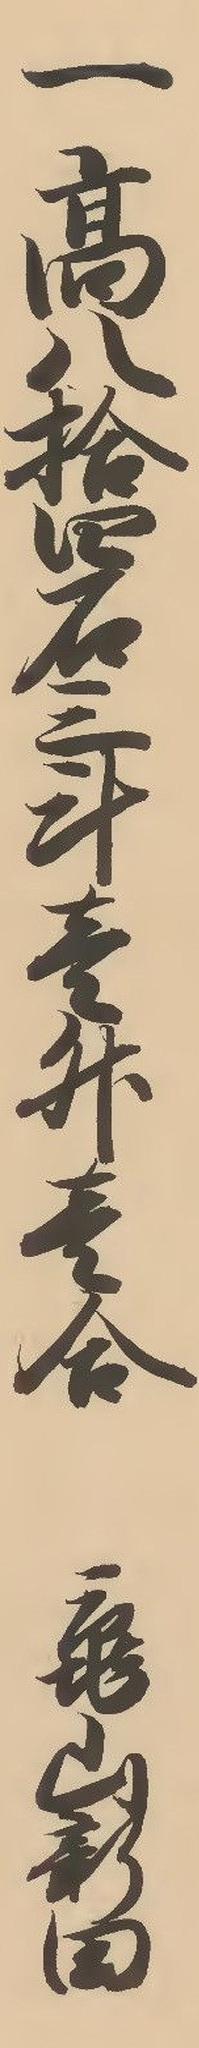一高八拾四石三斗壱升壱合亀山新田
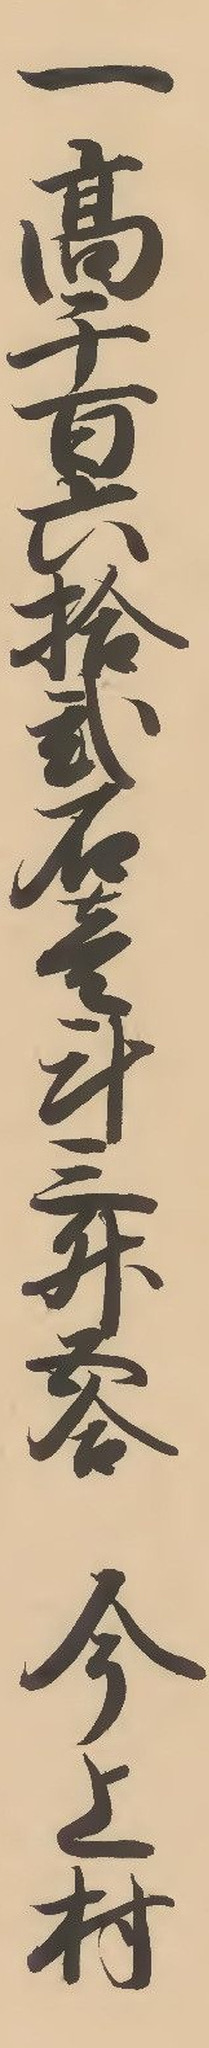一高千百六拾弐石壱斗三升五合今上村
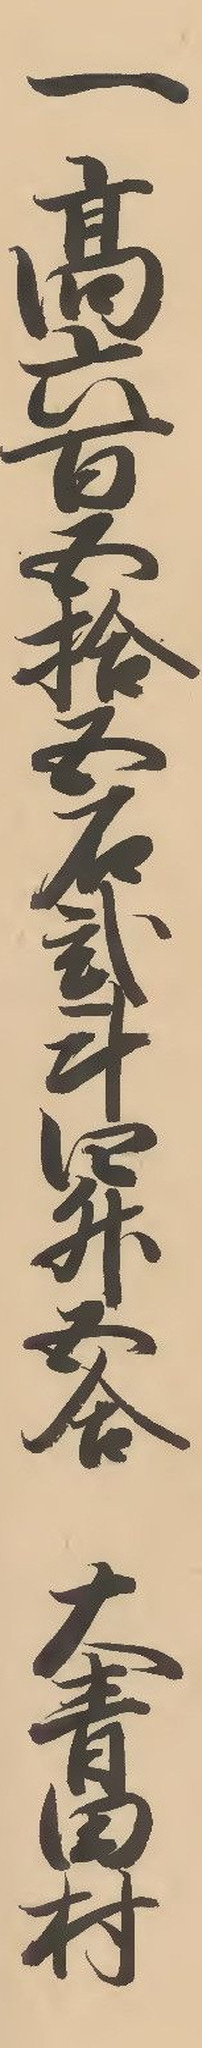一高六百五拾五石弐斗四升五合大青田村
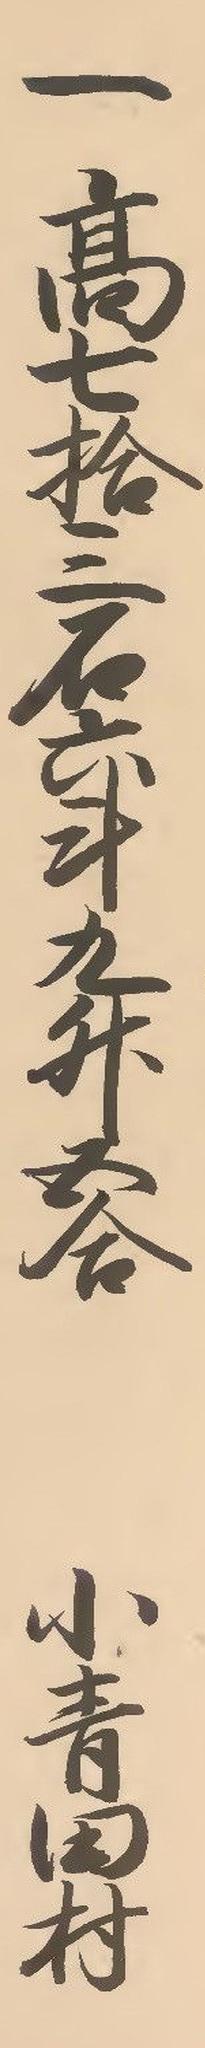一高七拾三石六斗九升五合小青田村
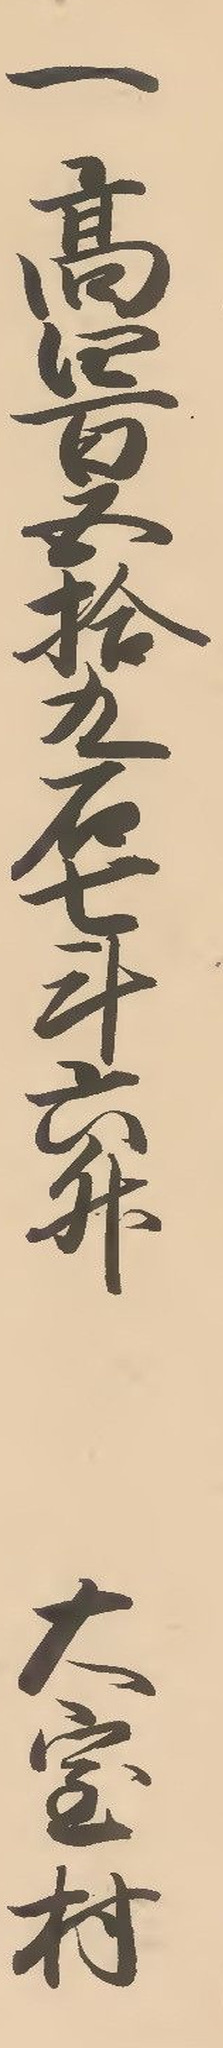一高四百五拾九石七斗六升大室村
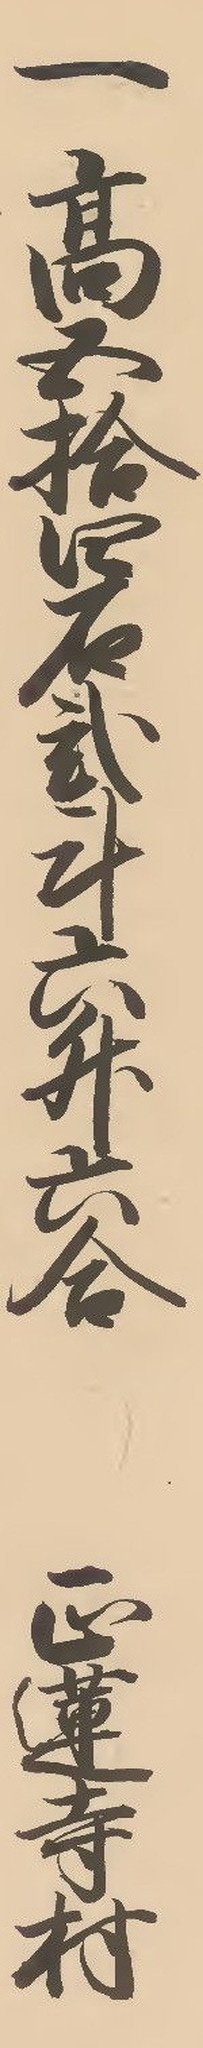一高五拾四石弐斗六升六合正蓮寺村
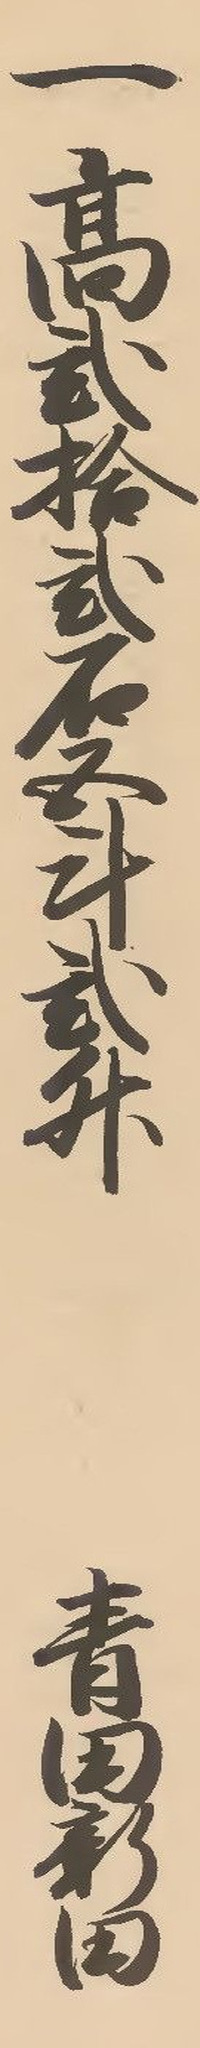一高弐拾弐石五斗弐升青田新田

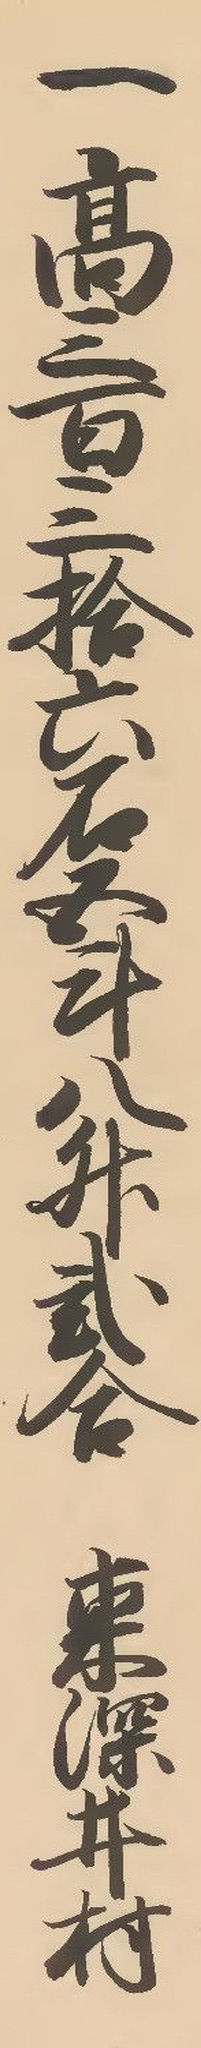一高三百三拾六石五斗八升弐合東深井村
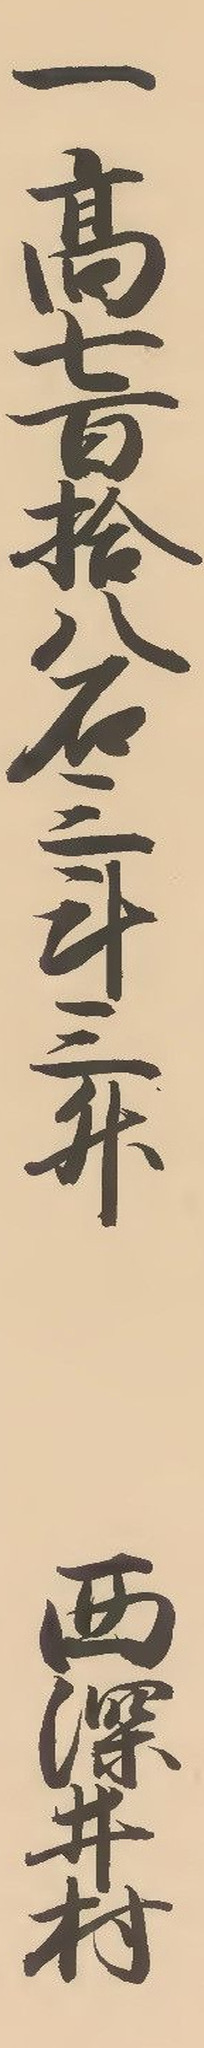一高七百拾八石三斗三升西深井村
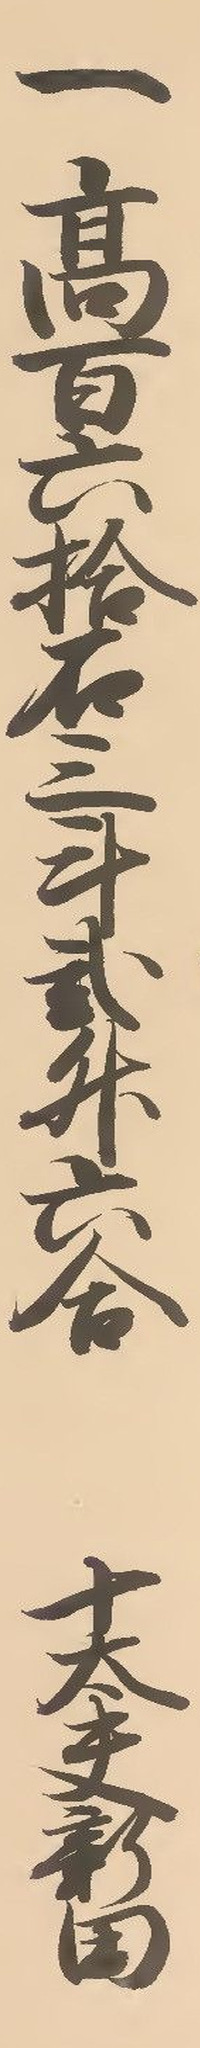一高百六拾石三斗弐升六合十太夫新田
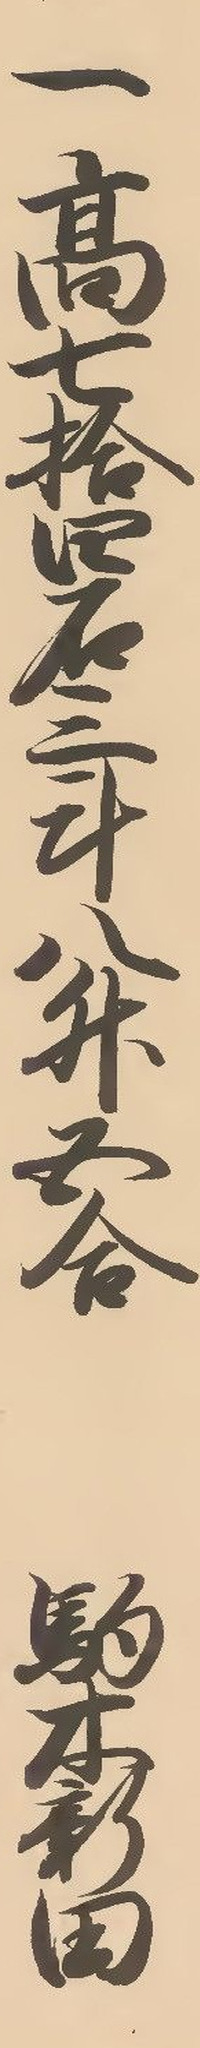一高七拾四石三斗八升五合駒木新田
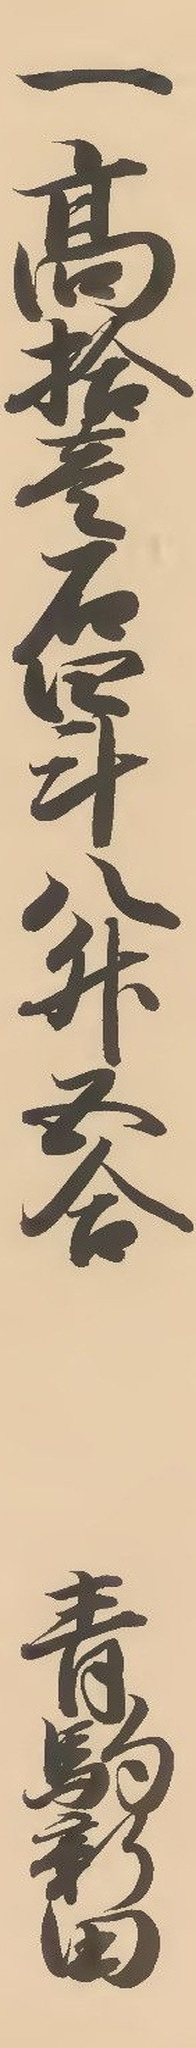一高拾壱石四斗八升五合青駒新田
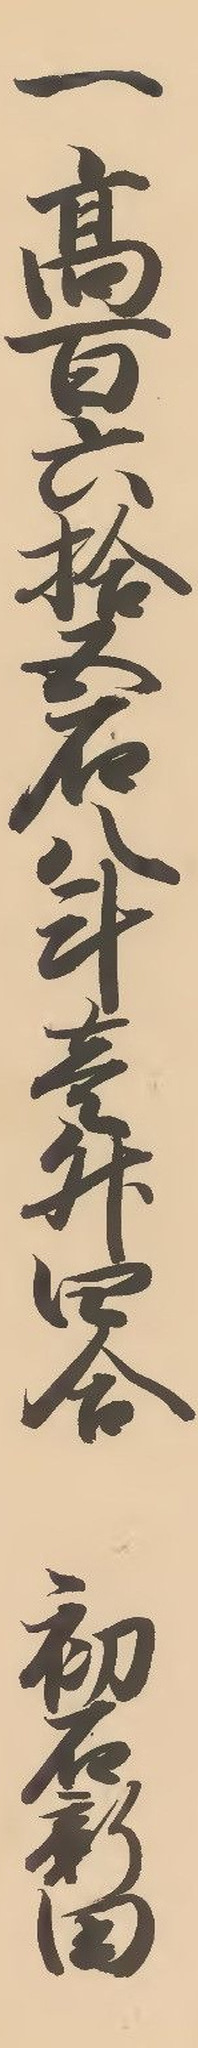一高百六拾五石八斗壱升四合初石新田

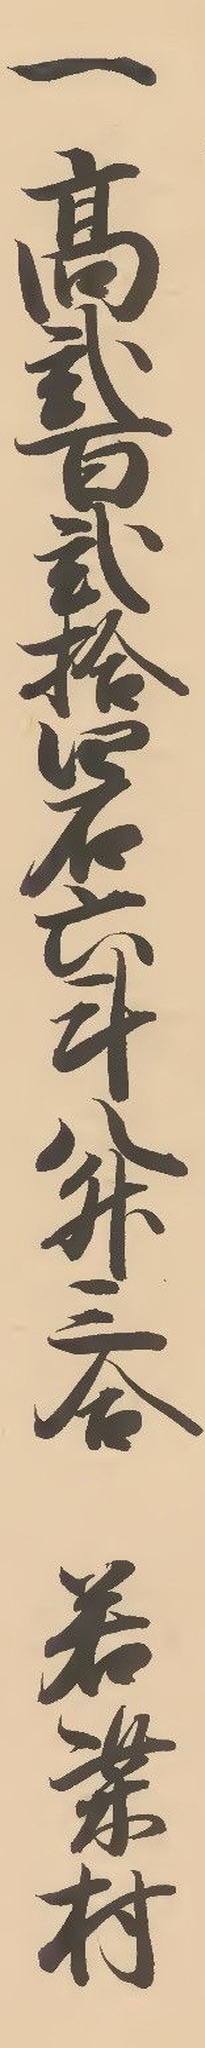一高弐百弐拾四石六斗八升三合若葉村
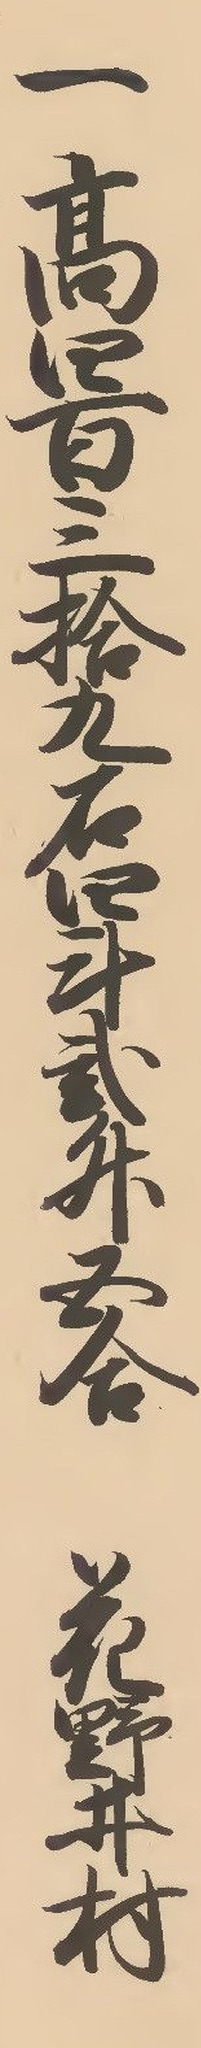一高四百三拾九石四斗弐升五合花野井村
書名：下総国郷帳
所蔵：国立公文書館 National Archives of Japan
